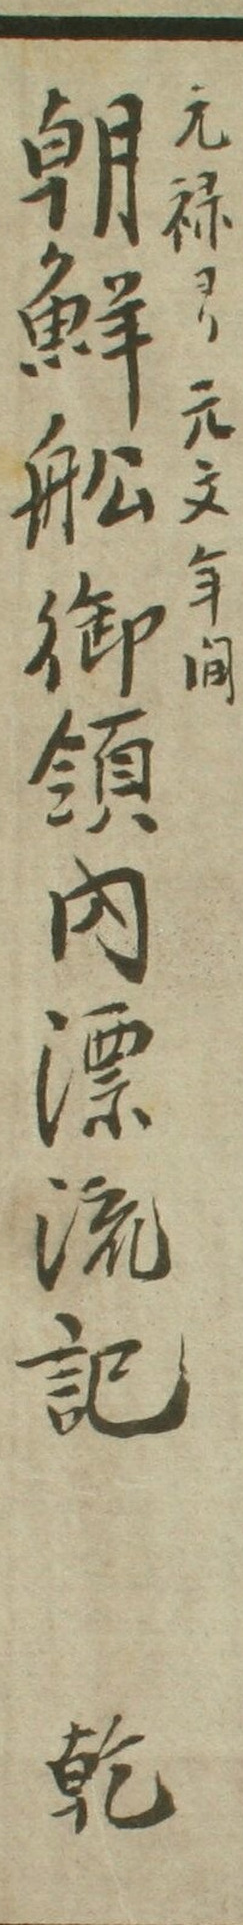朝鮮舩御領内漂流記乾
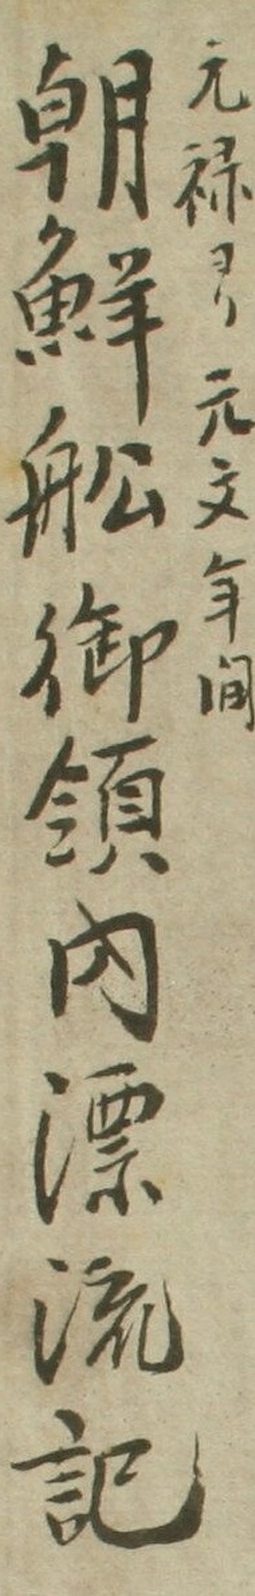朝鮮舩御領内漂流記乾

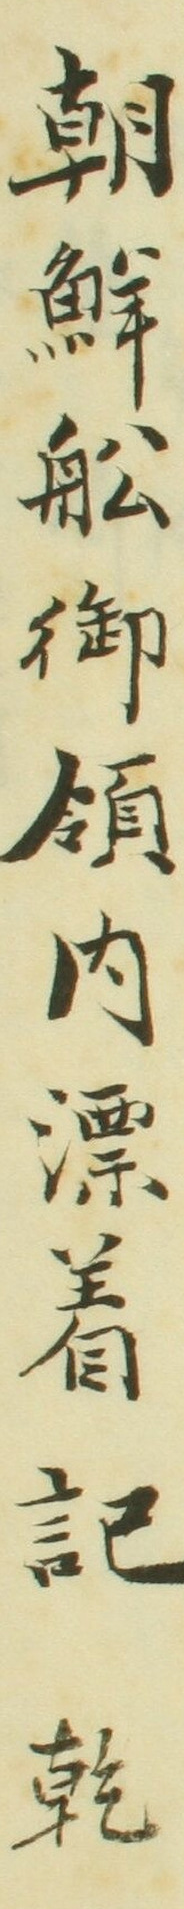朝鮮舩御領内漂着記乾

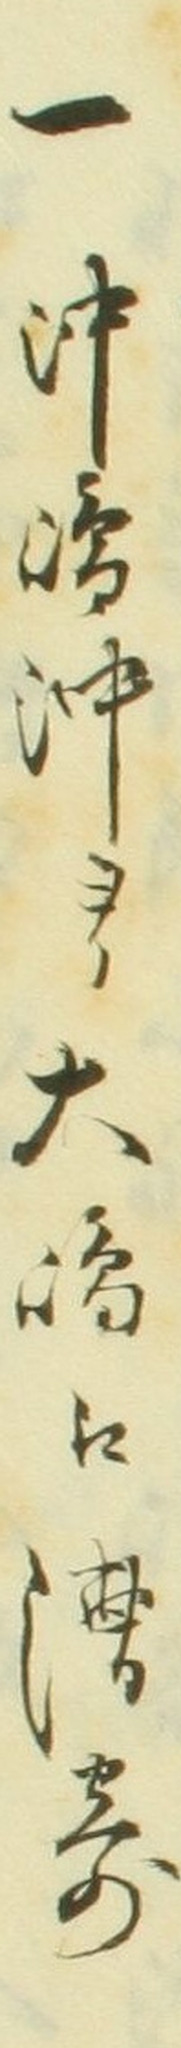一沖島沖ヨリ大島え漕寄
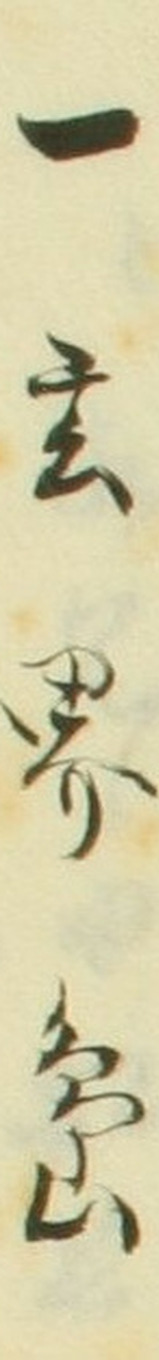一玄界島
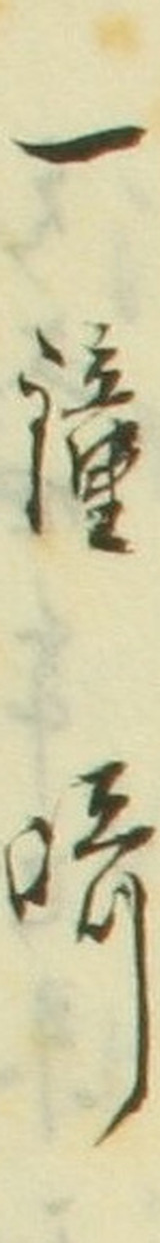一鐘崎

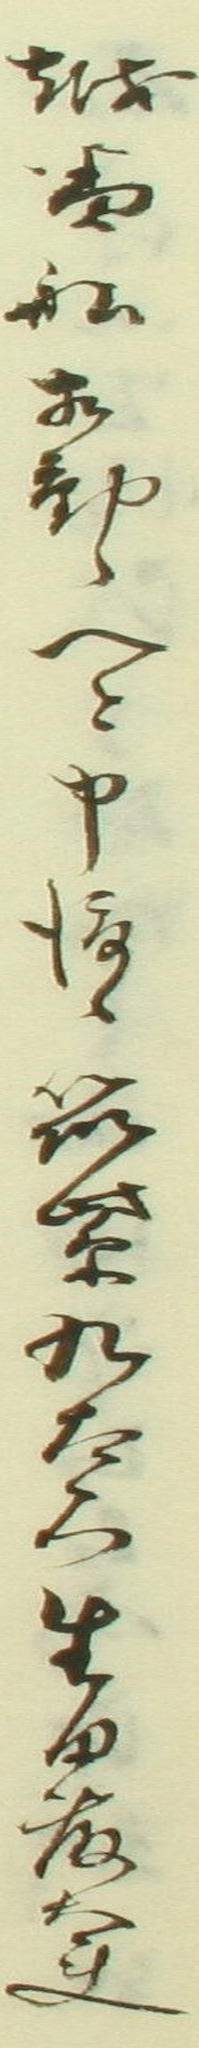越番船相勤候へと申渡候筑紫九左衛門生田藤太夫
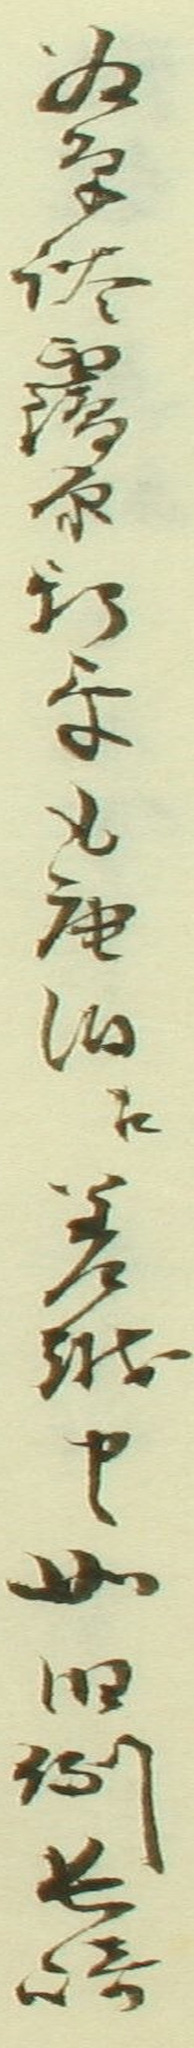為筆談靏原新平も唐泊え差越申候如旧例長崎
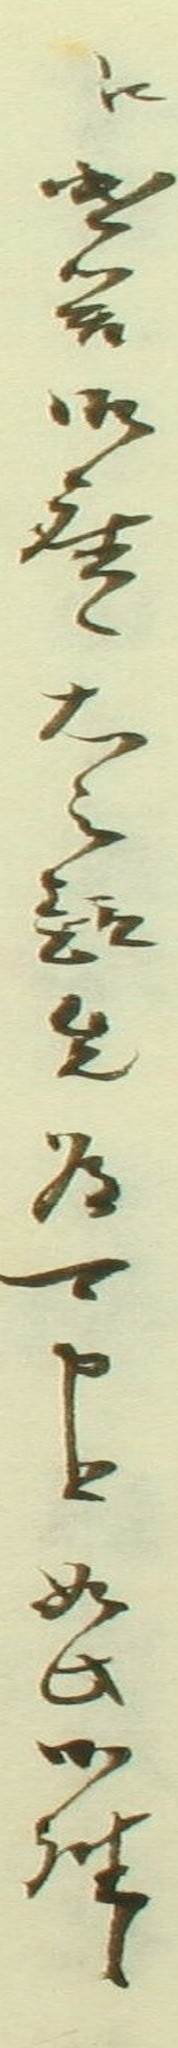え遣筈御座候右之趣先為可申上如此御座候
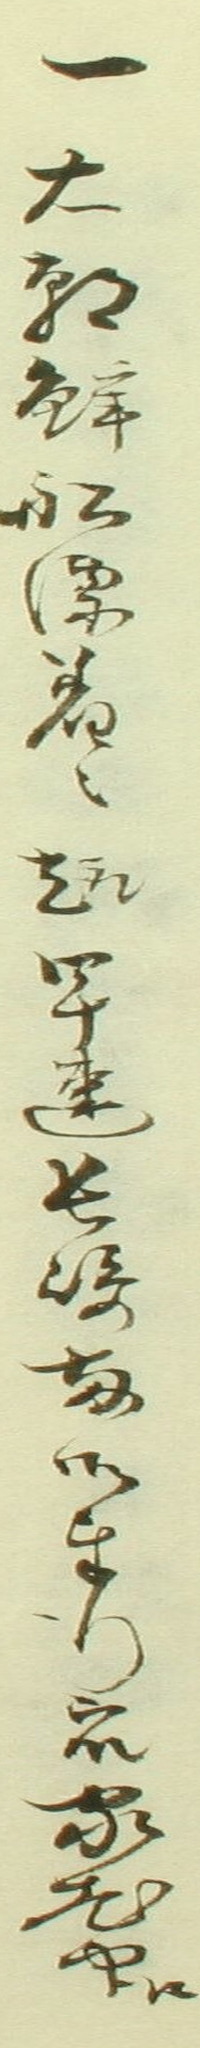一右朝鮮船漂着之趣早速長崎両御奉行衆家老中え
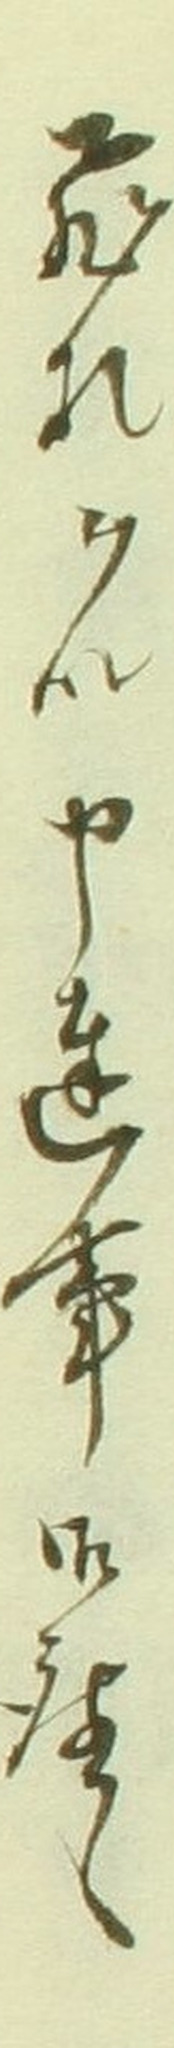飛札ヲ以申達事御座候
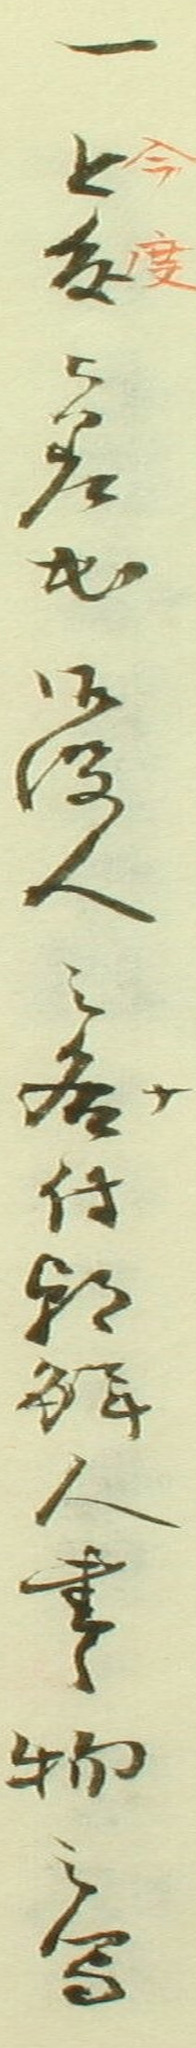一今度被差出御役人之名付朝鮮人書候物之写
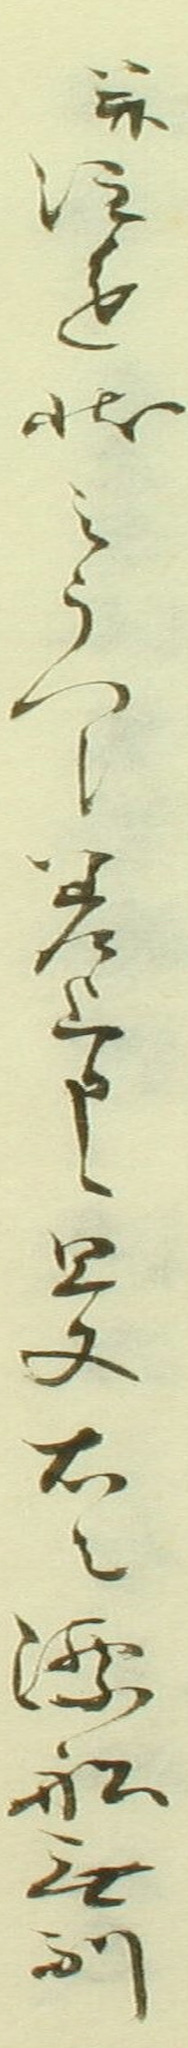幷注進状之うつし差上申候且又右之漂船無別
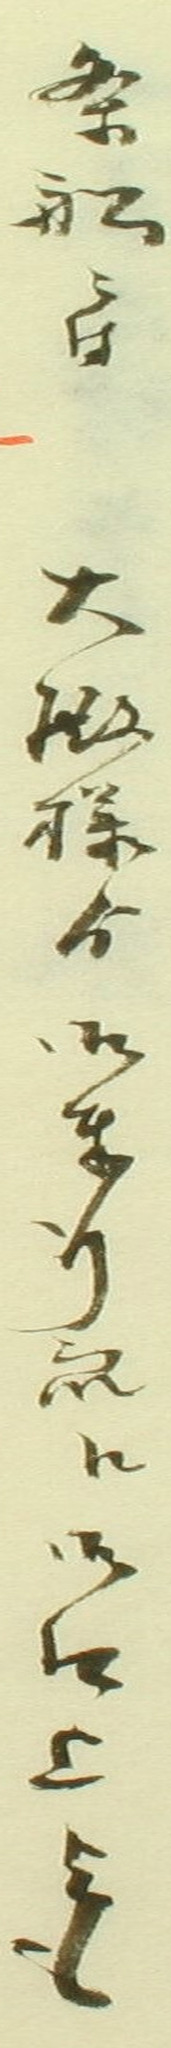条船ニ付大殿様より御奉行衆え御口上とも
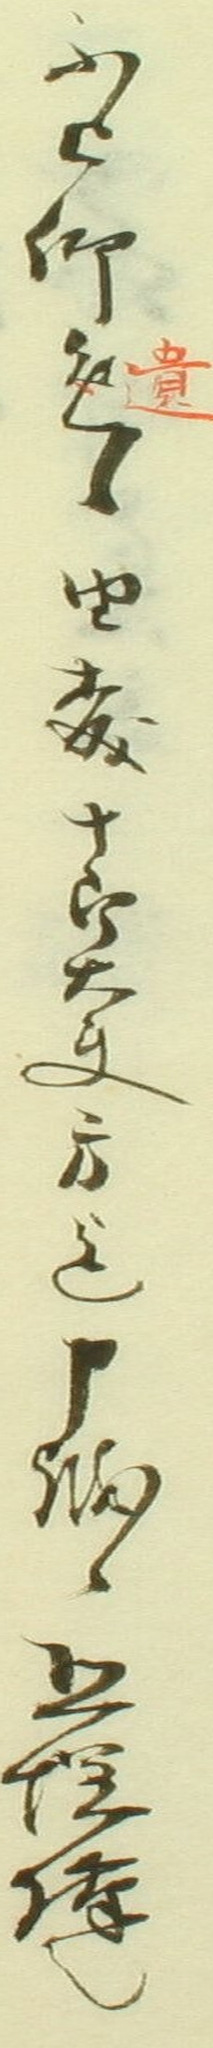不被仰遣候由森十郎大夫方迄申越候恐惶謹言
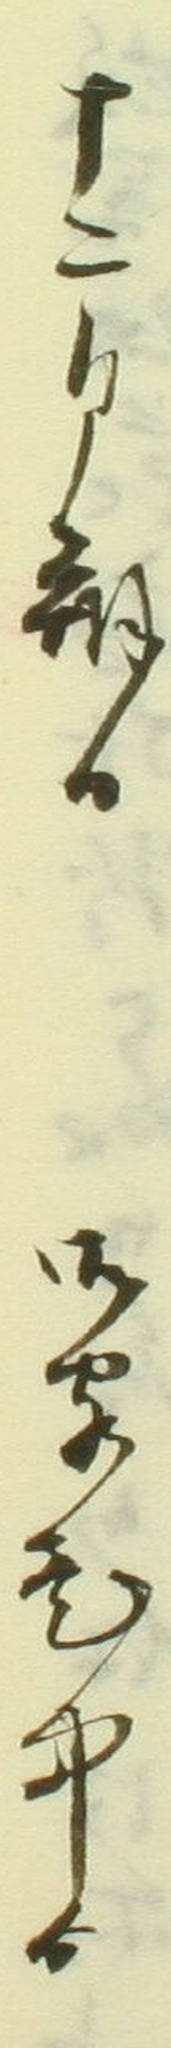十二月朔日御家老中より
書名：朝鮮船御領内漂流記 乾
